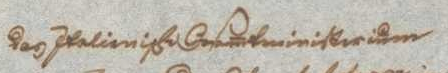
Das Italienische Gesammtministerium
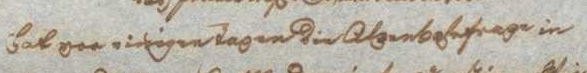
hat vor einigen Tagen die Alpenbahnfrage in
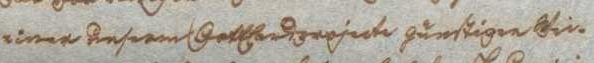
einer unserem Gotthardprojecte günstigen Wei-
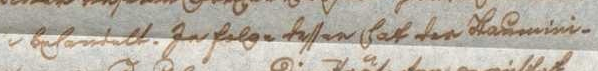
se behandelt. In Folge dessen hat der Baumini-
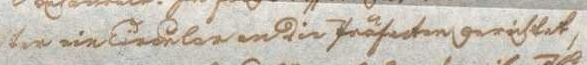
ster ein Circular an die Präfecten gerichtet,
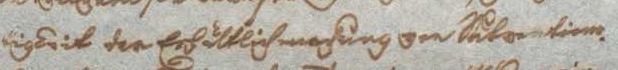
tigkeit der Erhältlichmachung von Subventions-
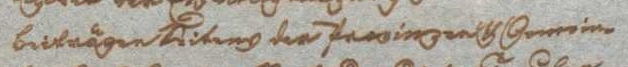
beiträgen Seitens der Provinzen & Gemein-
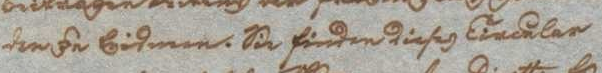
den zu widmen. Sie finden dieses Circular
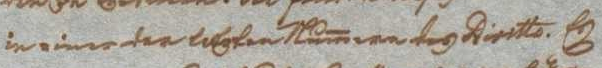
in einer der letzten Nummern des Diritto. Es
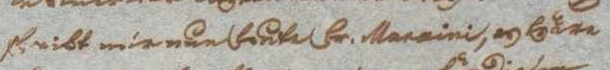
schreibt mir nun heute Hr. Maraini, es wäre
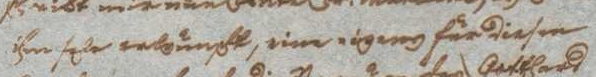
ihm sehr erwünscht, eine eigens für diesen
